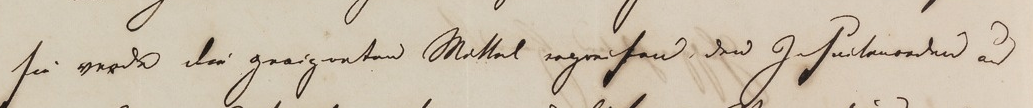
sie werde die geeigneten Mittel ergreifen, den Jesuitenorden aus
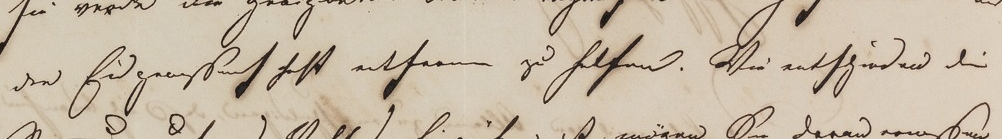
der Eidgenossenschaft entfernen zu helfen. Wie entschieden die
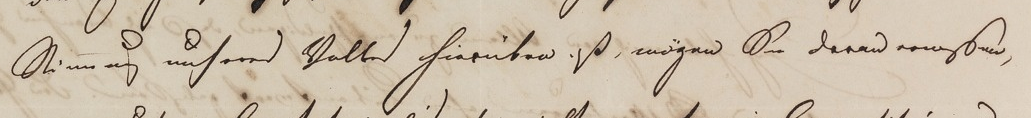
Stimmung unseres Volkes hierüber ist, mögen Sie daran ermessen,
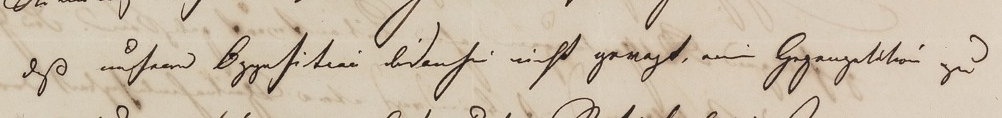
daß unsere Opposition bisanhin nicht gewagt, eine Gegenpetition zu
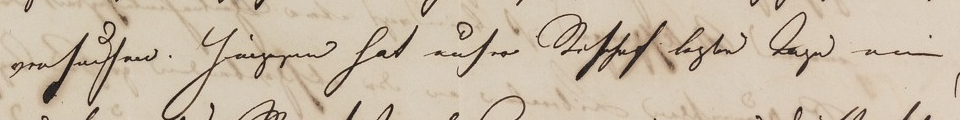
versuchen. Hingegen hat unser Bischof lezter Tage ein
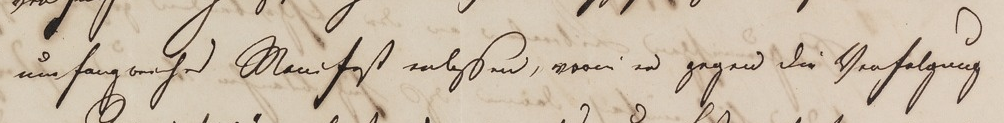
umfangreiches Manifest erlassen, worin er gegen die Verfolgung
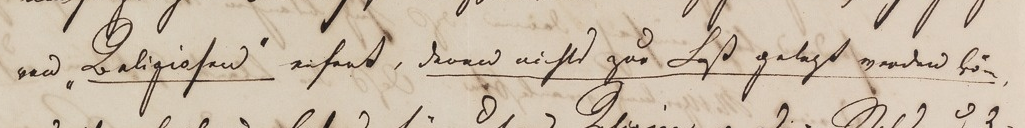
von «Religiosen» eifert, denen nichts zur Last gelegt werden
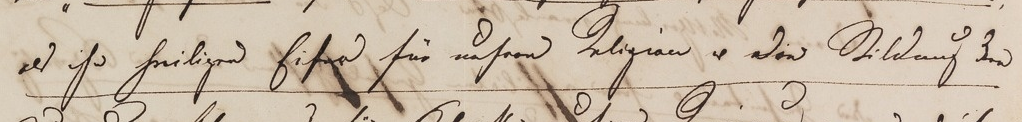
als ihr heiliger Eifer für unsere Religion & die Bildung der
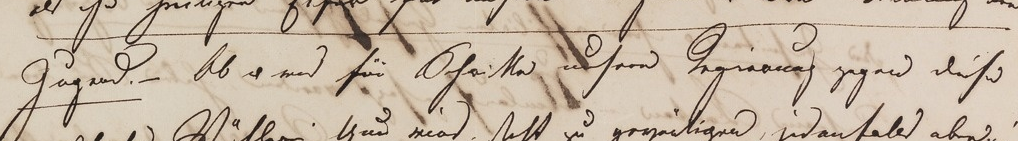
Jugend. – Ob & was für Schritte unsere Regierung gegen
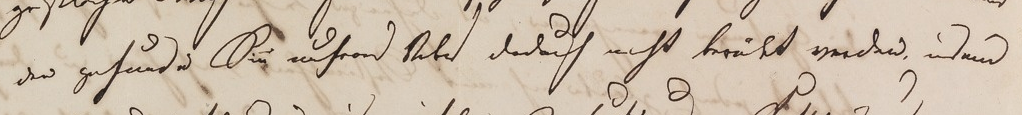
der gesunde Sinn unseres States dadurch nicht berükt werden, indem
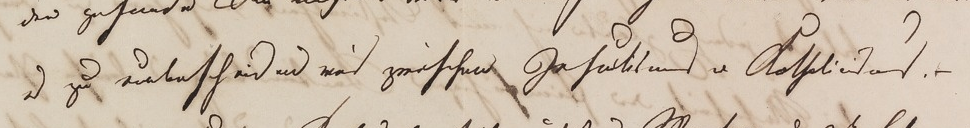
er zu unterscheiden weis zwischen Jesuitismus & Katholicismus. –
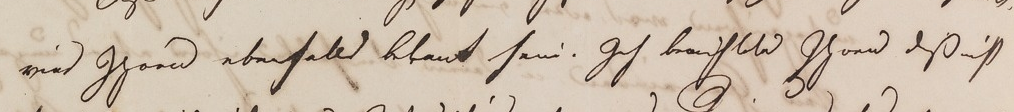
wird Ihnen ebenfalls bekant sein. Ich berichtete Ihnen dieß nicht
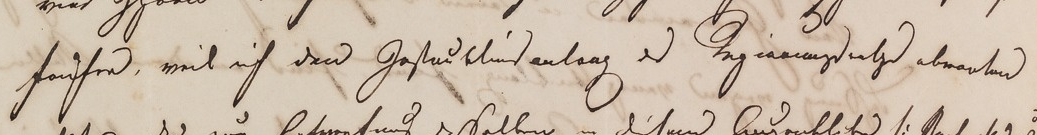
früher, weil ich den Instruktionsantrag des Regierungsraths abwarten
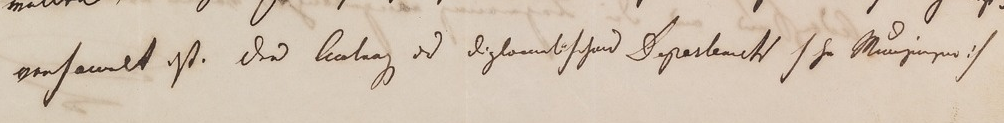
versamelt ist. Der Antrag des diplomatischen Departements (Hr Munzinger)
